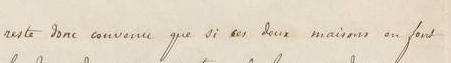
reste donc convenu que si ces deux maisons en font
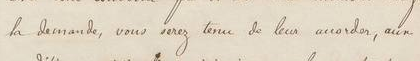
la demande, vous serez tenu de leur accorder, aux
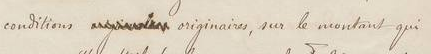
conditions ... originaires, sur le montant qui
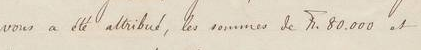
vous a été attribué, les sommes de Fr. 80.000 et
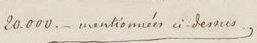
20.000.– mentionnées ci-dessus.
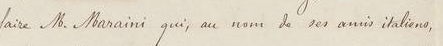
faire M. Maraini qui, au nom de ses amis italiens,
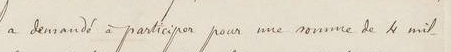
a demandé à participer pour une somme de 4 mil-
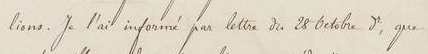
lions. Je l'ai informé par lettre du 28 Octobre dr, que
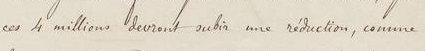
ces 4 millions devront subir une réduction, comme
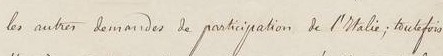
les autres demandes de participation de l'Italie; toutefois
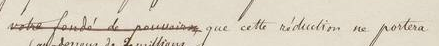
votre fondé de pouvoirs que cette réduction ne portera
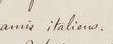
amis italiens.
